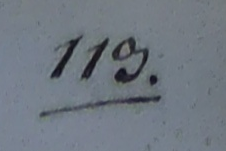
113.
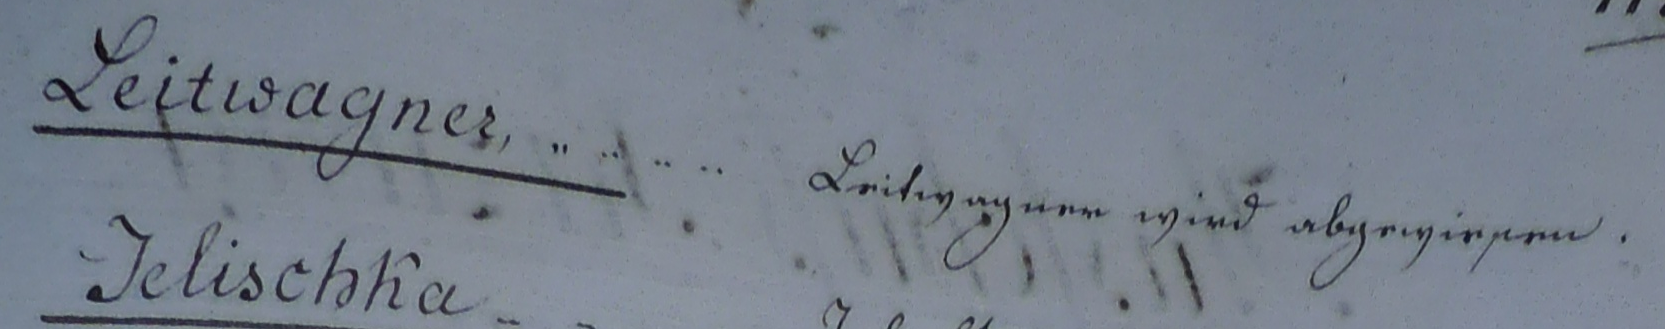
Leitwagner, .. .. .. .. Leitwagner wird abgewiesen.
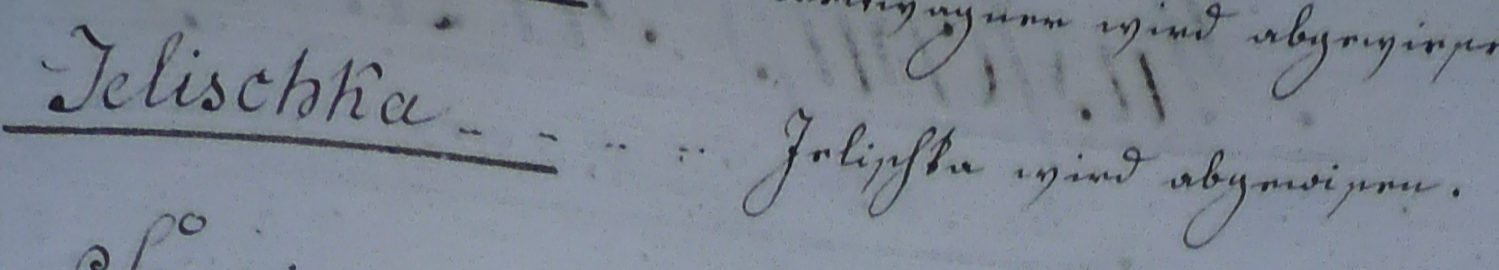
Jelischka .. .. .. .. Jelischka wird abgewiesen.
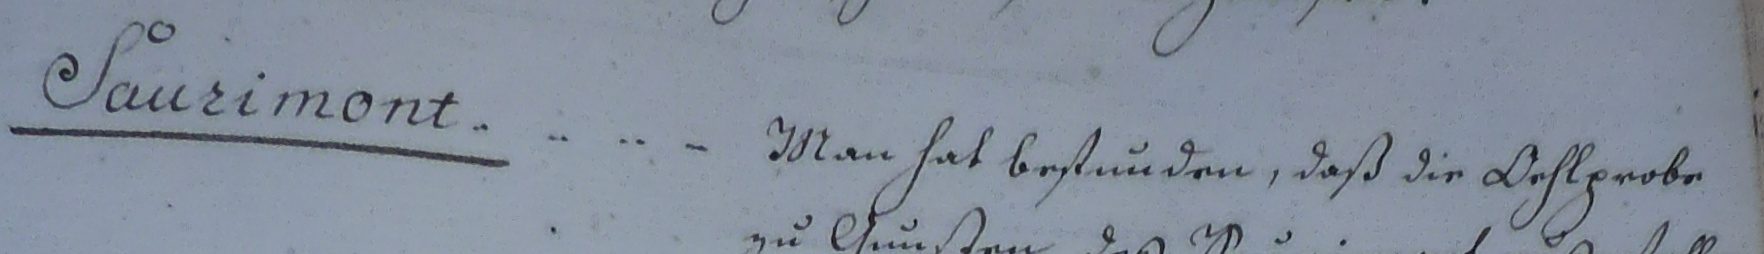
Saurimont .. .. .. .. Man hat befunden, daß die Oehlprobe
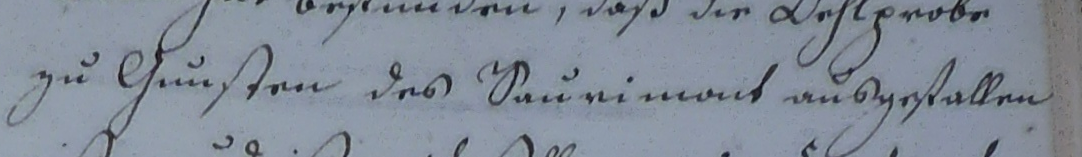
zu Gunsten des Saurimont ausgefallen
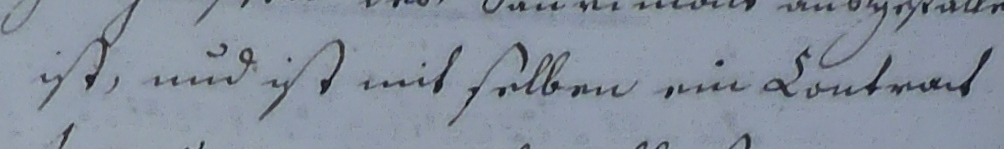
ist, und ist mit selben ein Contract
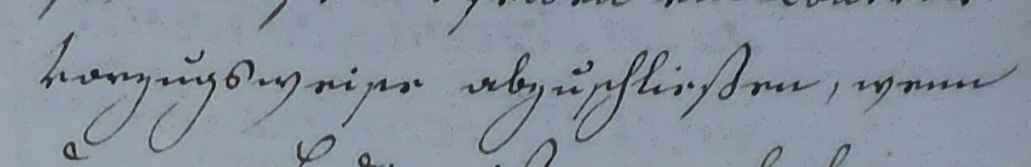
vorzugsweise abzuschließen, wenn
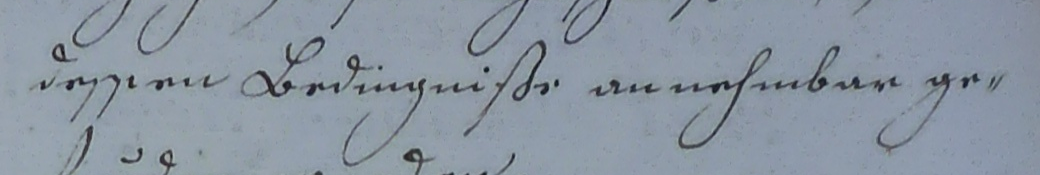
dessen Bedingniße annehmbar ge¬
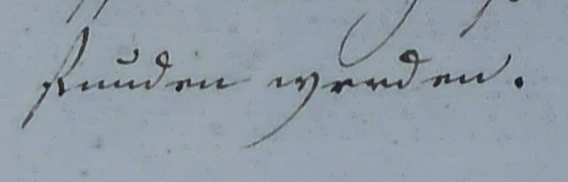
funden werden.
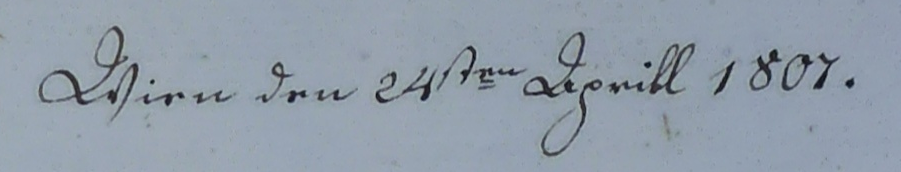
Wien den 24ste͇n Aprill 1807.
